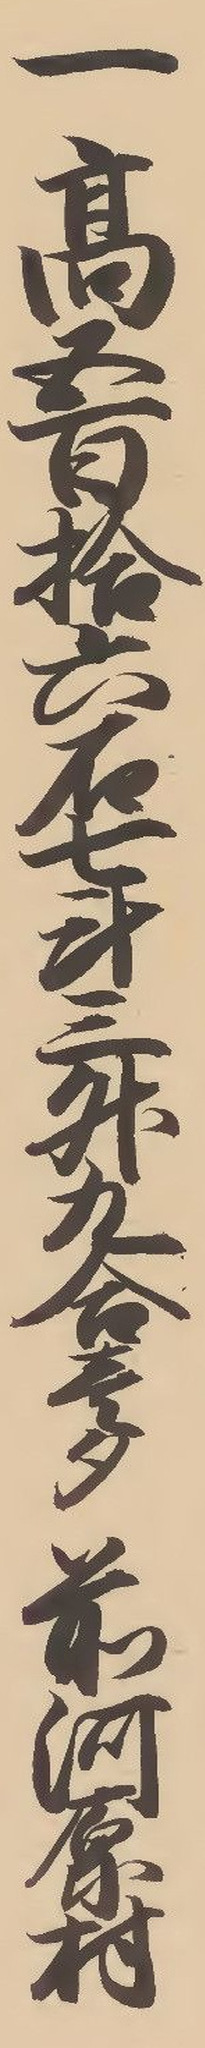一高五百拾六石七斗三升九合壱勺前河原村
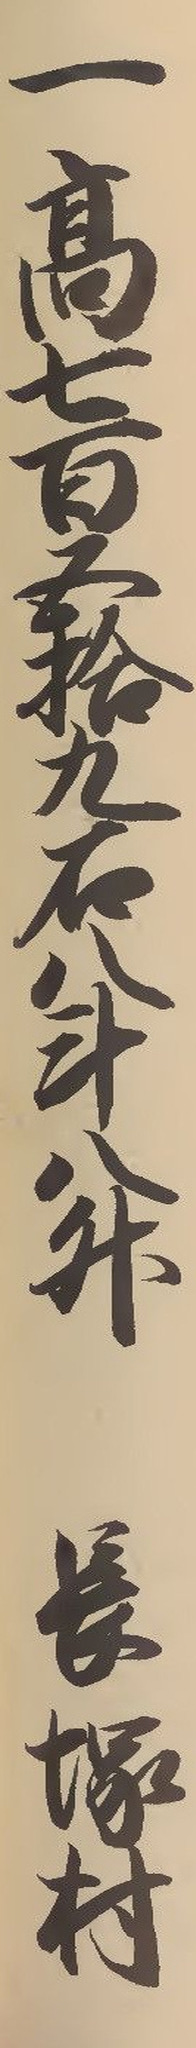一高七百五拾九石八斗八升長塚村
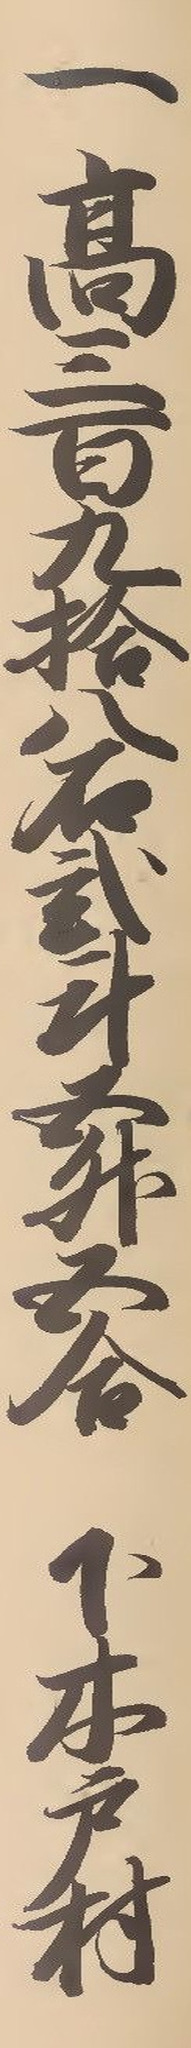一高三百九拾八石弐斗五升五合下木戸村
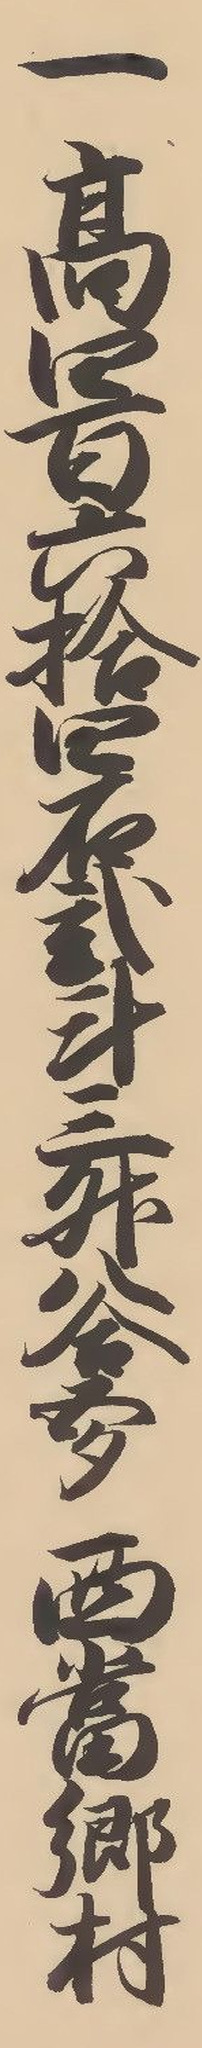一高四百六拾四石弐斗三升八合五勺西当郷村
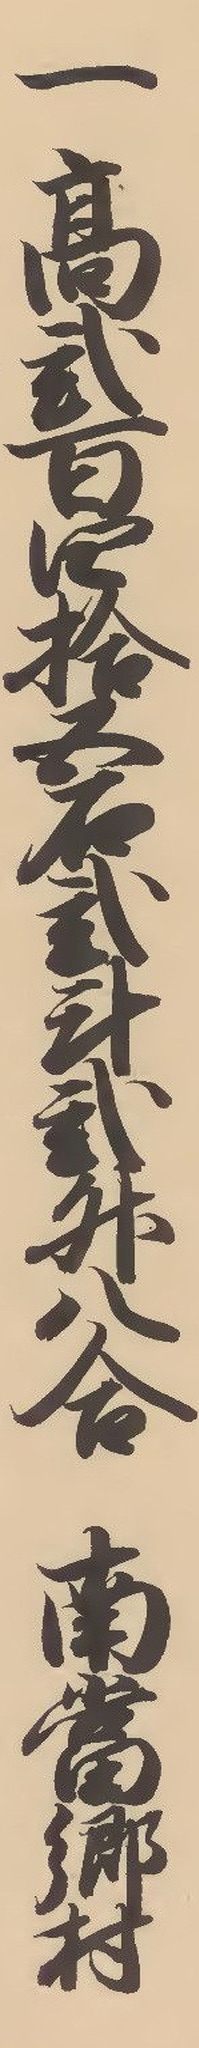一高弐百四拾五石弐斗弐升八合南当郷村
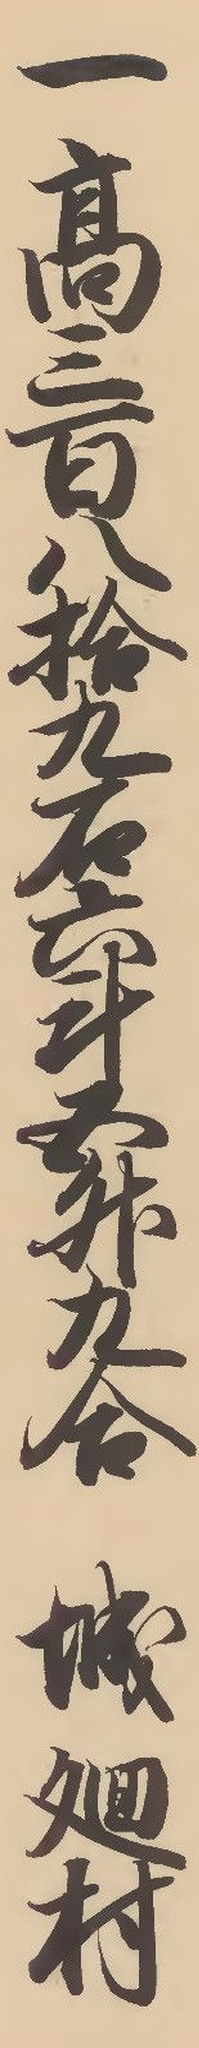一高三百八拾九石六斗五升九合城廻村

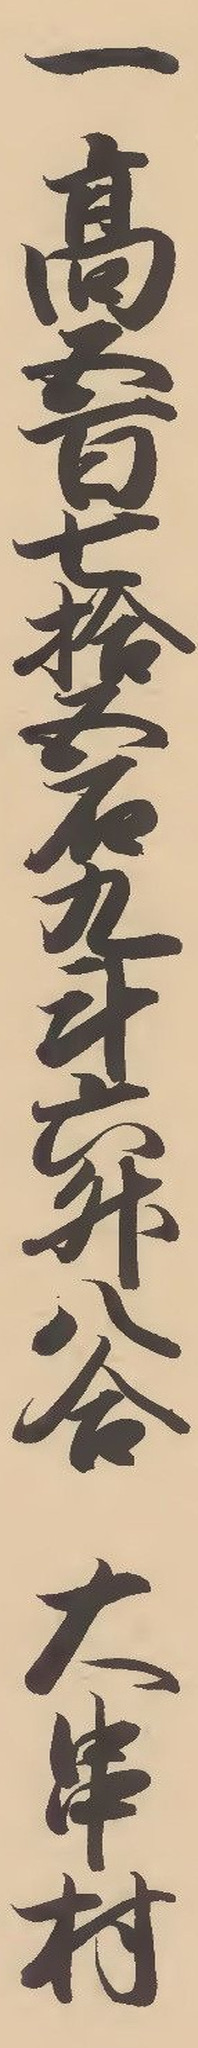一高五百七拾五石九斗六升八合大串村
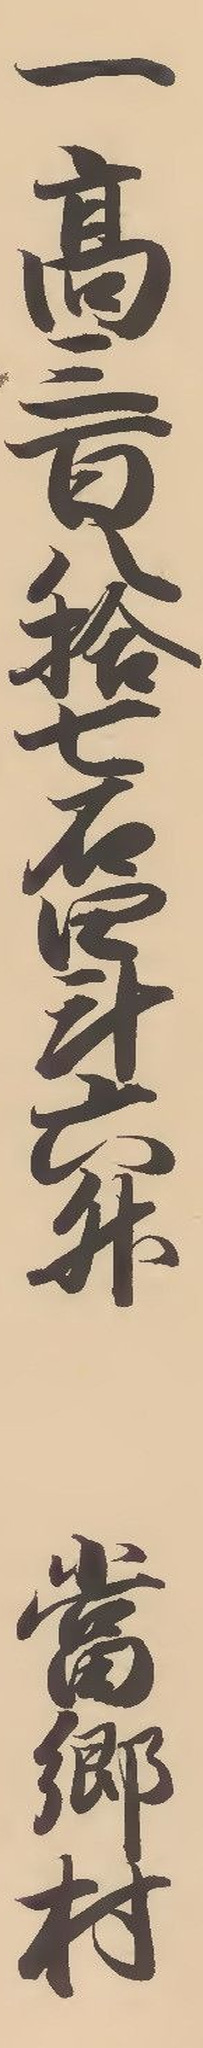一高三百八拾七石四斗六升当郷村
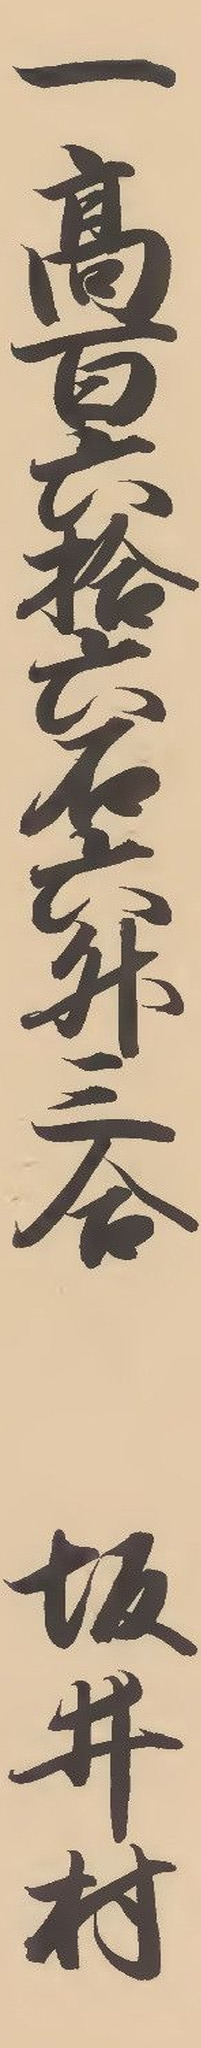一高百六拾六石六升三合坂井村
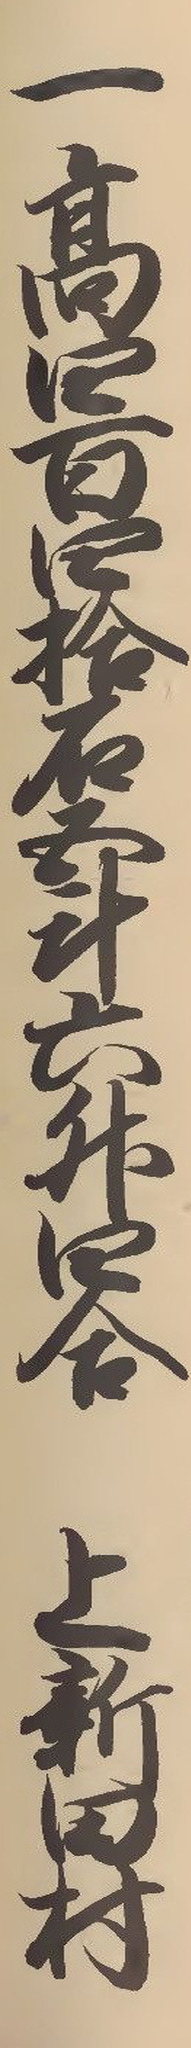一高四百四拾石五斗六升四合上新田村
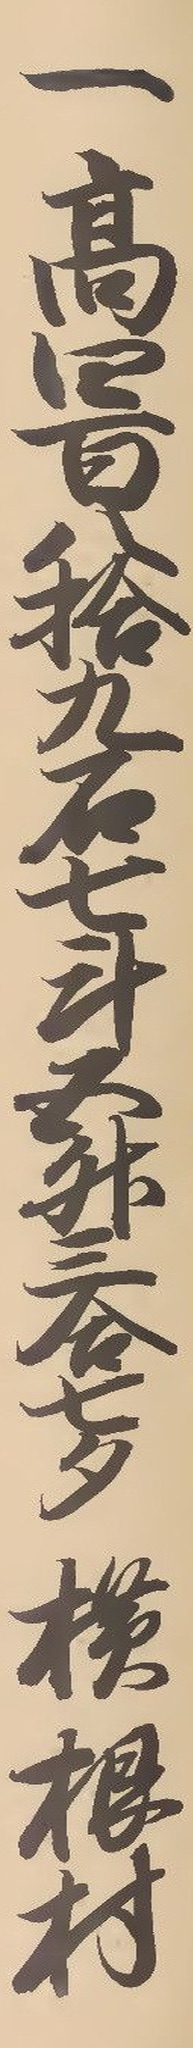一高四百八拾九石七斗五升三合七勺横根村
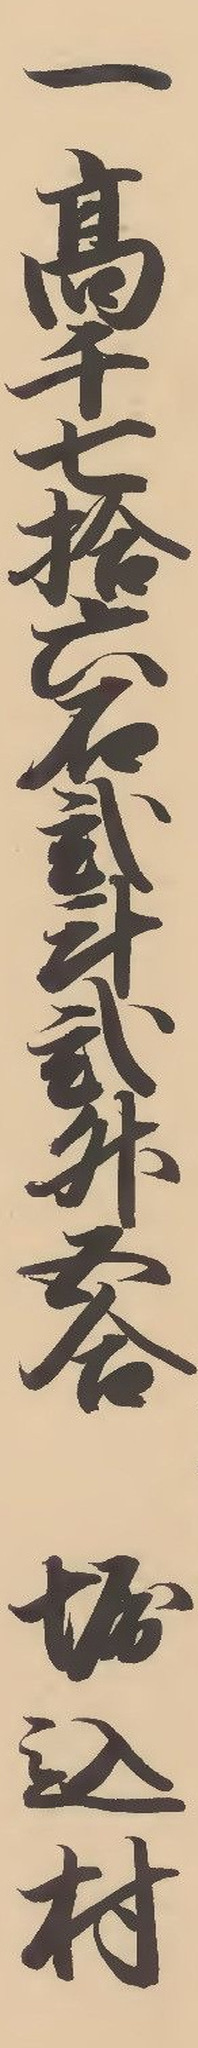一高千七拾六石弐斗弐升五合堀込村
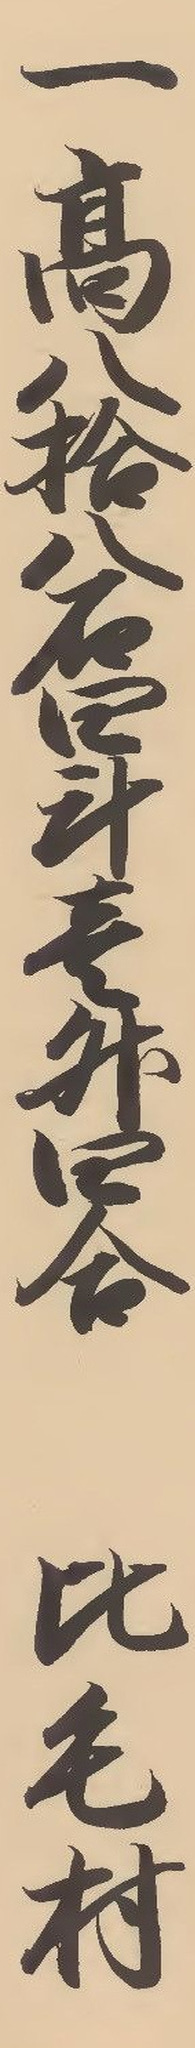一高八拾八石四斗壱升四合比毛村
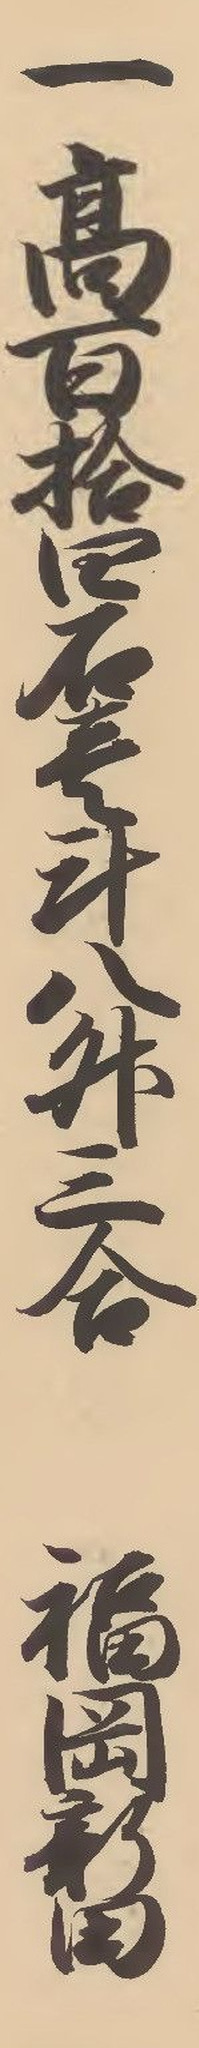一高百拾四石壱斗八升三合福岡新田

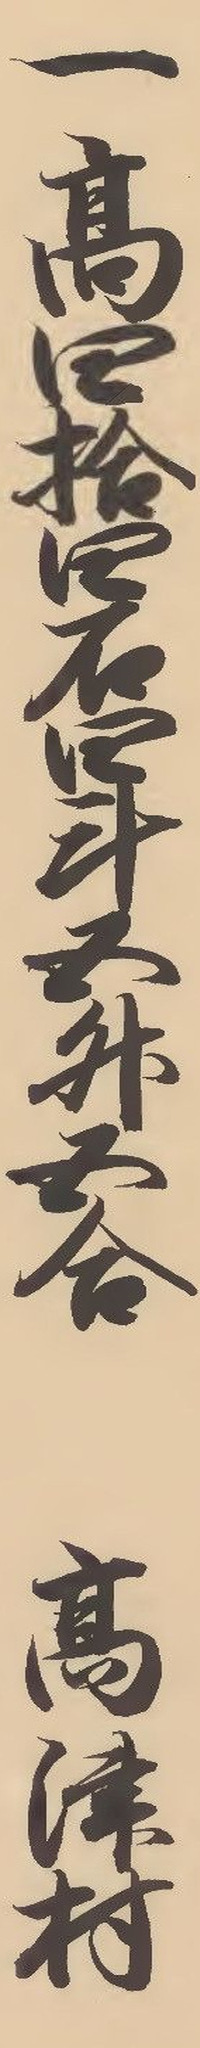一高四拾四石四斗五升五合高津村
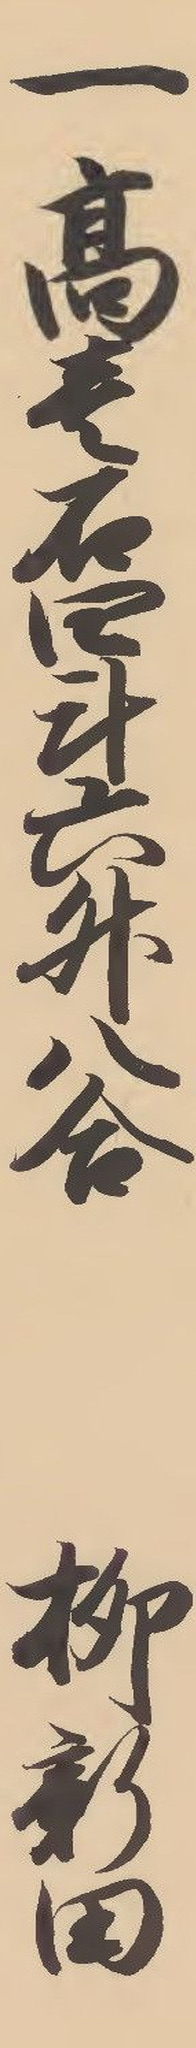一高壱石四斗六升八合柳新田
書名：常陸国郷帳
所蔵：国立公文書館 National Archives of Japan
